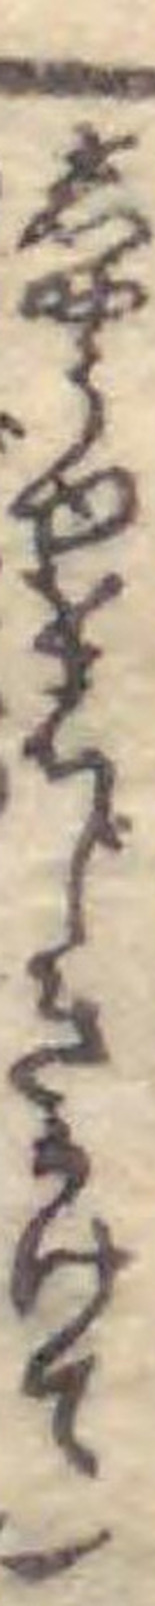しやうゆをはじきかけて
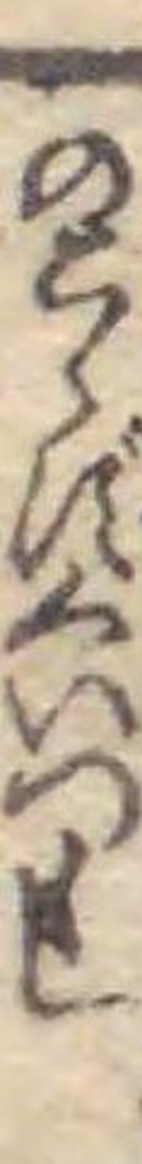のこらずくいつくし
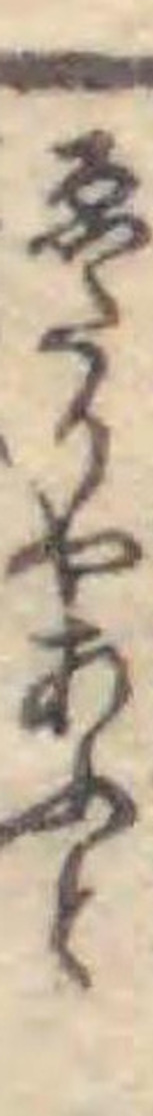ゑたりやあふと
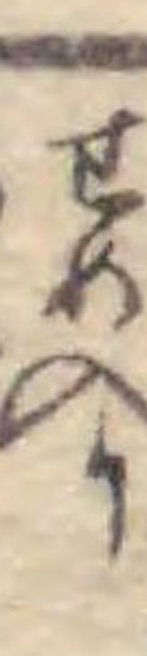せめ入り
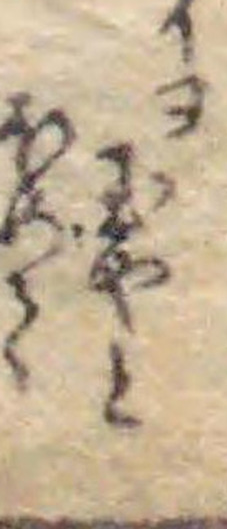ほめて
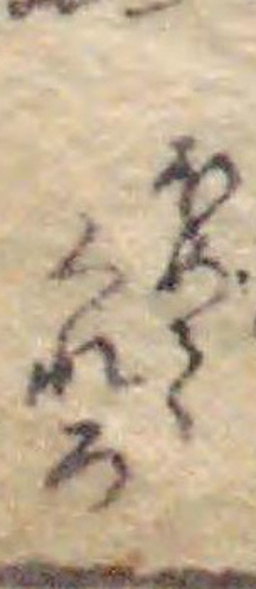くれろ
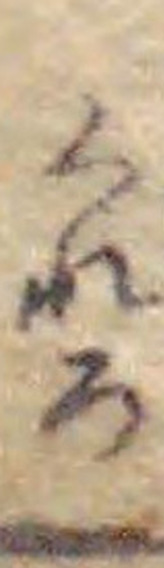くれろ

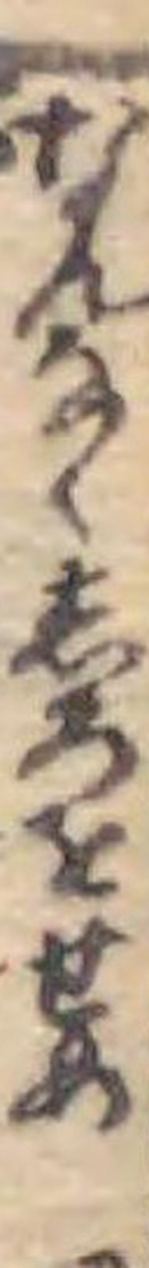なんなくしろをせめ
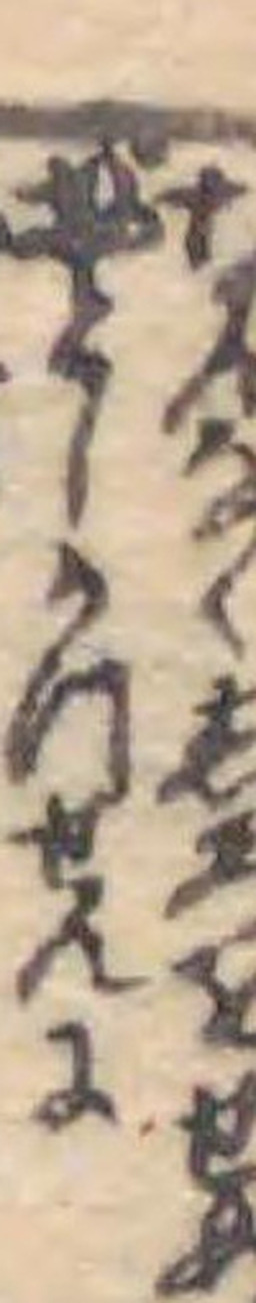おとしかつせんに
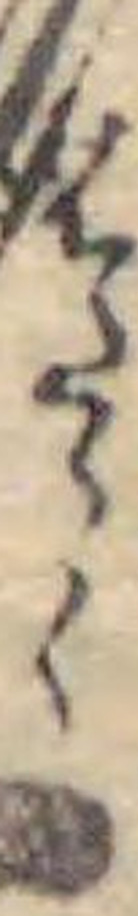はたらく
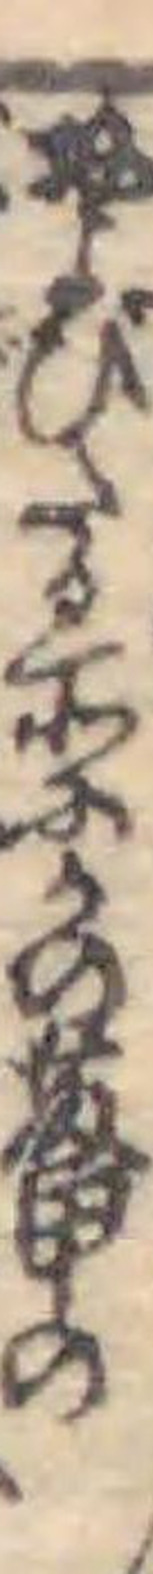およびたる所にかの藤甲の
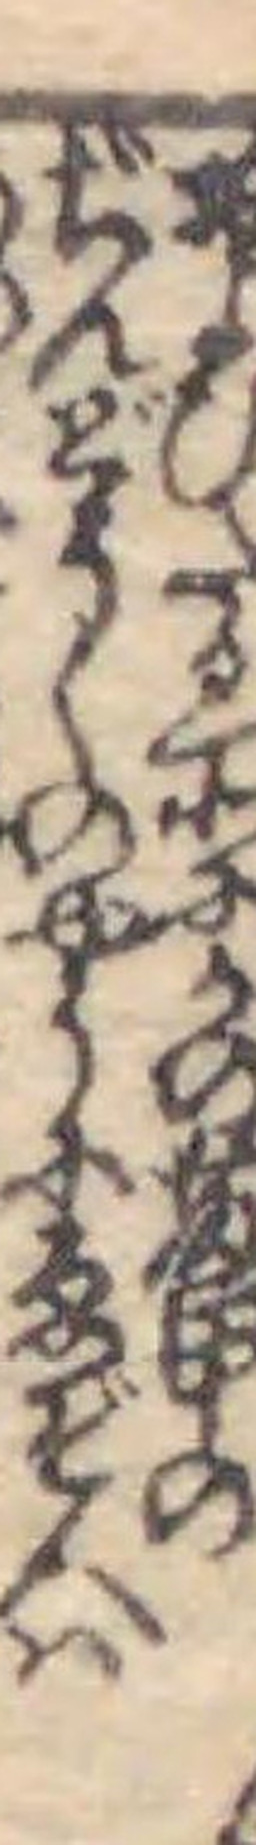ぢんどうくのやうにゑぞ人は
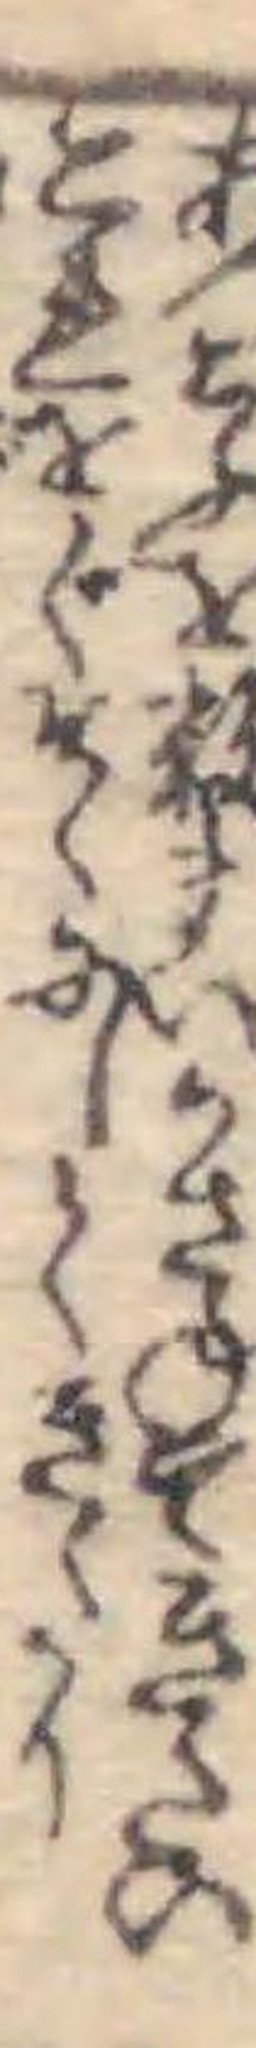これをぐそくにしてきたり
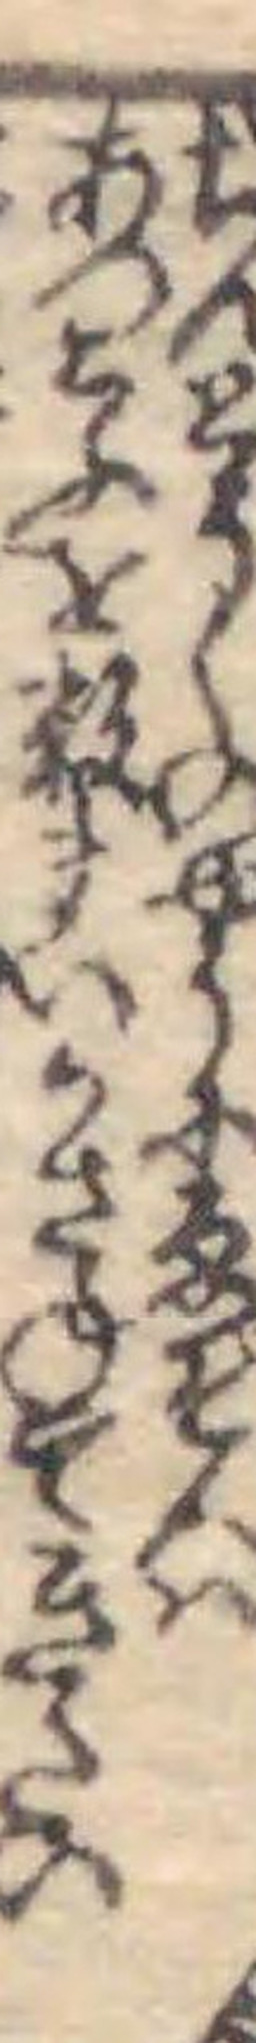あつこふを数まいかさねてきたい
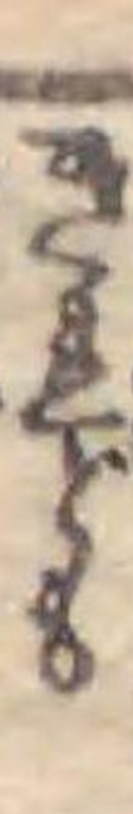きれども
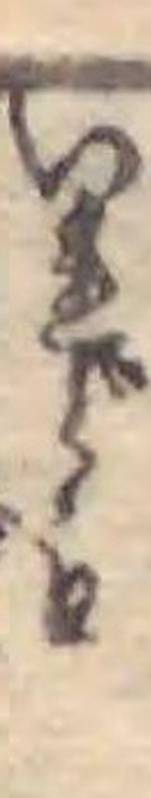いれども
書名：悦贔負蝦夷押領 : 3巻
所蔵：国立国会図書館 National Diet Library, JAPAN
